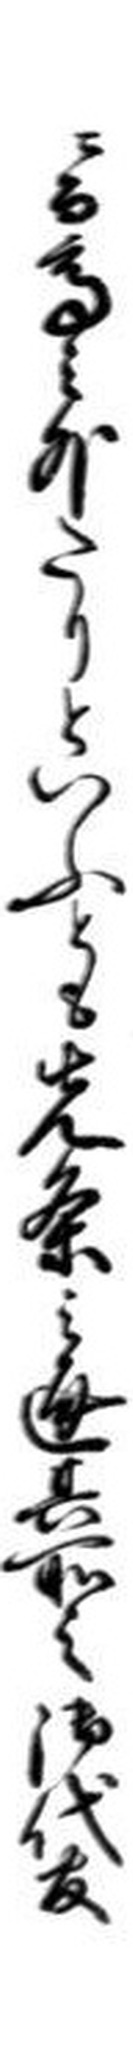ニ而高之外たりといふとも先条之通其所之御代官
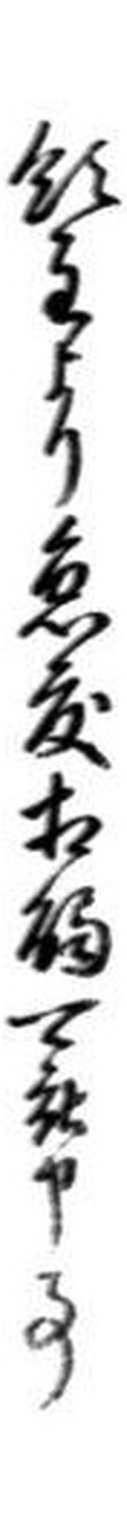領主より急度相触可被申事
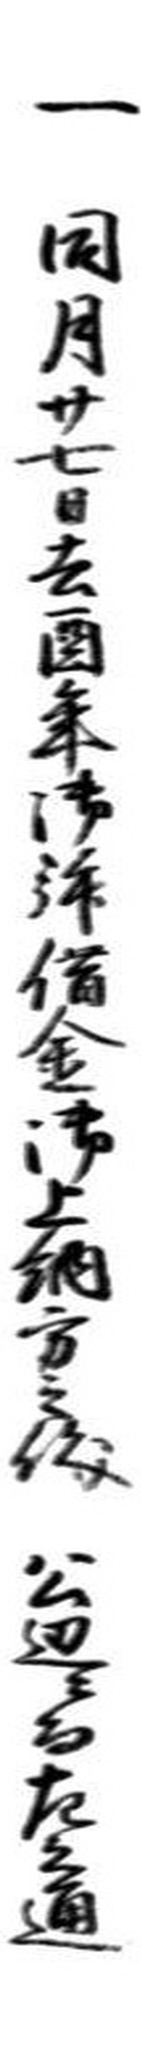一同月廿七日去酉年御拝借金御上納方之儀公辺ニ而左之通
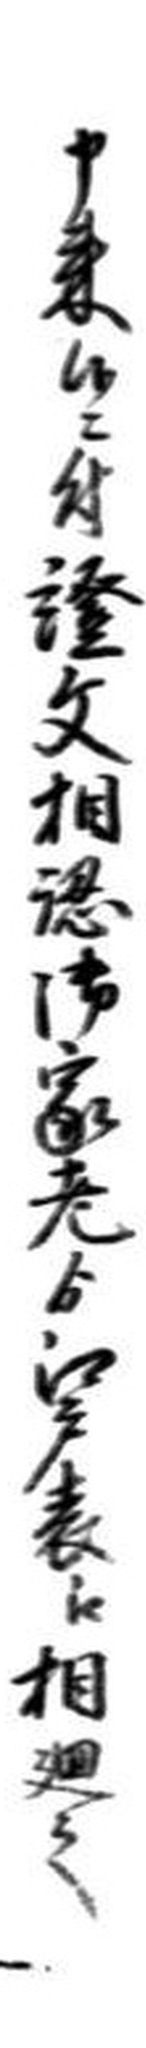申来候ニ付證文認御家老ゟ江戸表江相廻之一
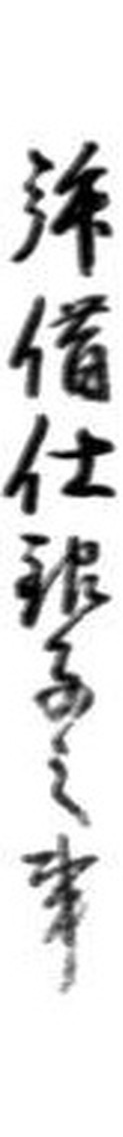拝借仕銀子之事
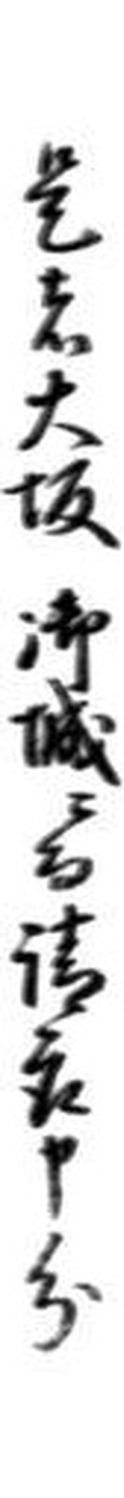是者大坂御城ニ而請取申分
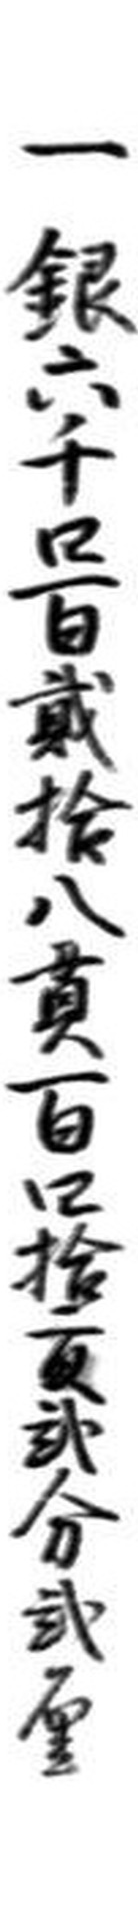一銀六千四百弐拾八貫百四拾匁弐分弐厘

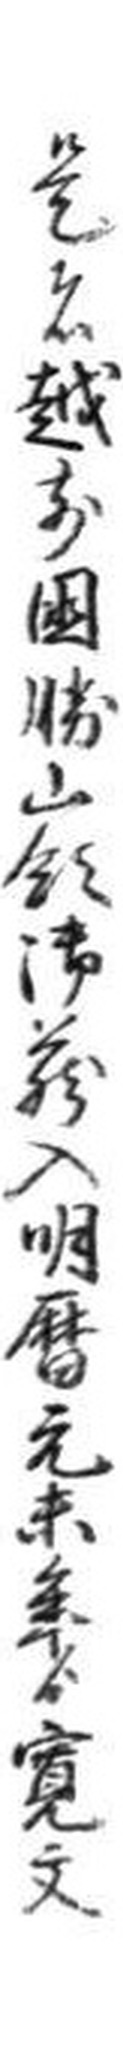是者越前国勝山領御蔵入明暦元未年ゟ寛文
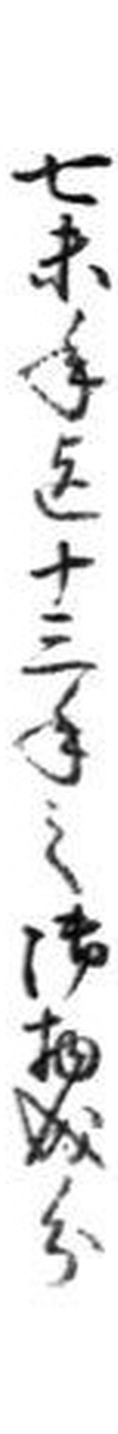七未年迄十三年之御物成分
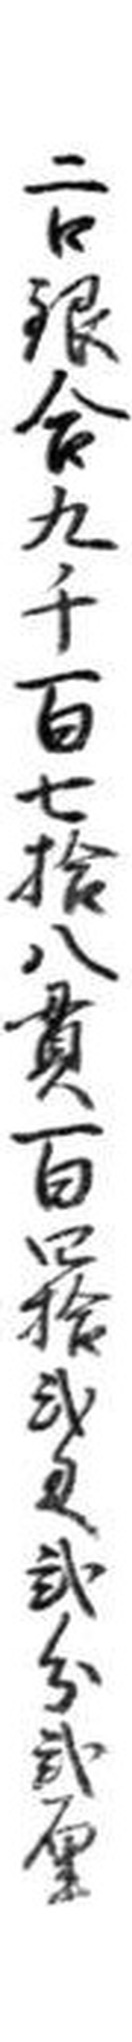二口銀合九千百七拾八貫百四拾弐匁弐分弐厘
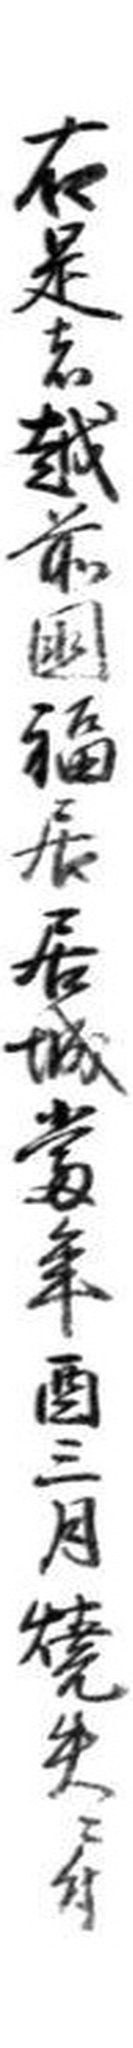右是者越前国福居居城当年酉三月焼失ニ付
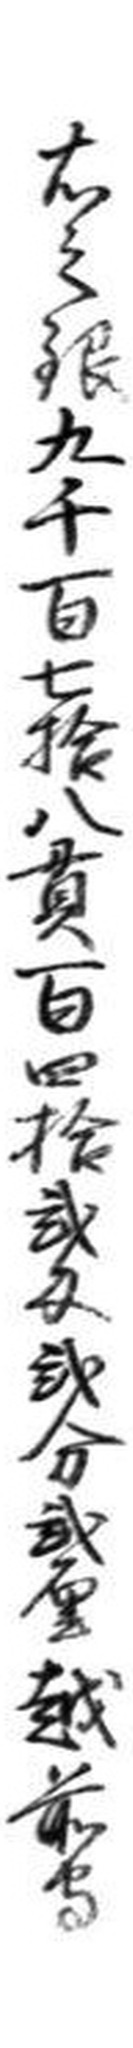右之銀九千百七拾八貫百四拾弐匁弐分弐厘越前守
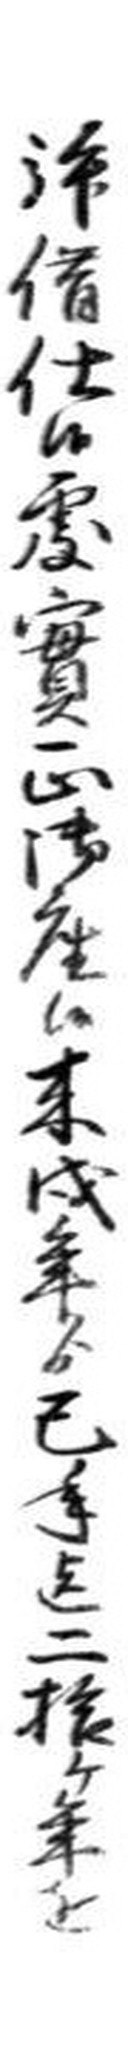拝借仕候処実正御座候来戌年ゟ巳年迄二拾ケ年を
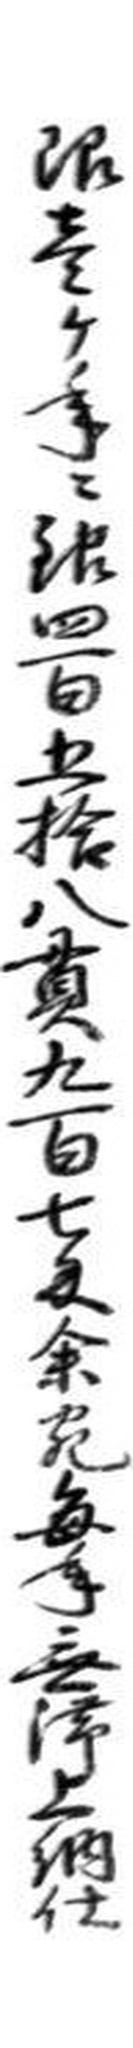限壱ケ年ニ銀四百五拾八貫九百七匁余宛毎年無滞上納仕
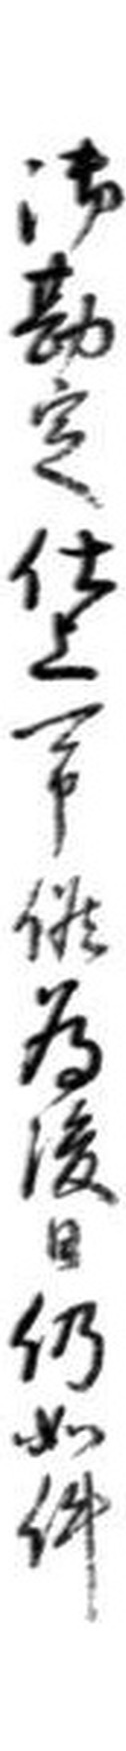御勘定仕上可申候為後日仍如件
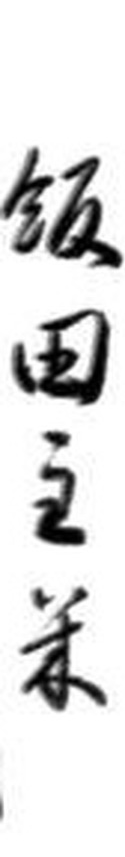飯田主米
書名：家譜 八 光通公 従寛文十年到同十二年
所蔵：福井県文書館 Fukui Prefectural Archives
